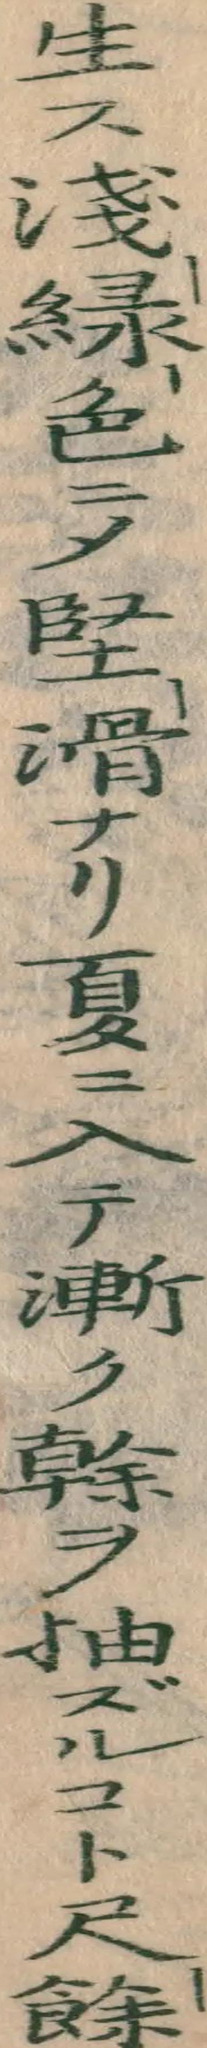生ス浅-緑-色ニシテ堅-滑ナリ夏ニ入テ漸ク幹ヲ抽ズルコト尺-余
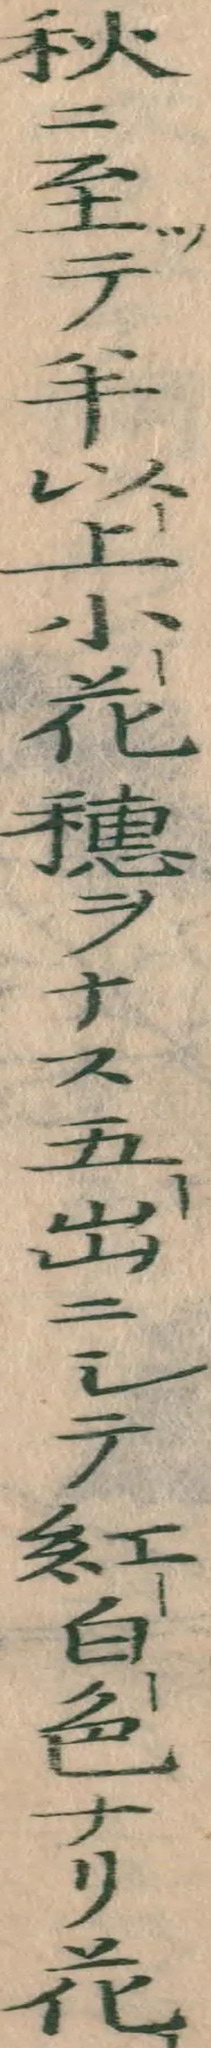秋ニ至テ半以-上小-花穂ヲナス五-出ニシテ紅-白-色ナリ花-
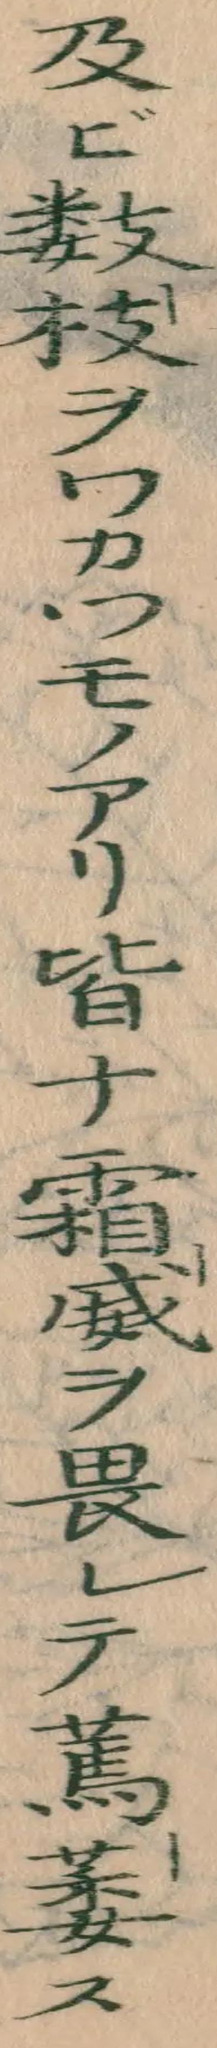及ビ数-枝ヲワカツモノアリ皆ナ霜-威ヲ畏レテ篤-萎ス
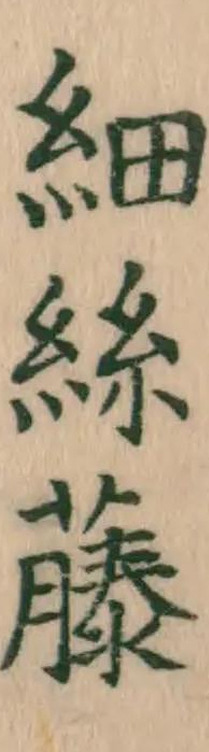細糸藤

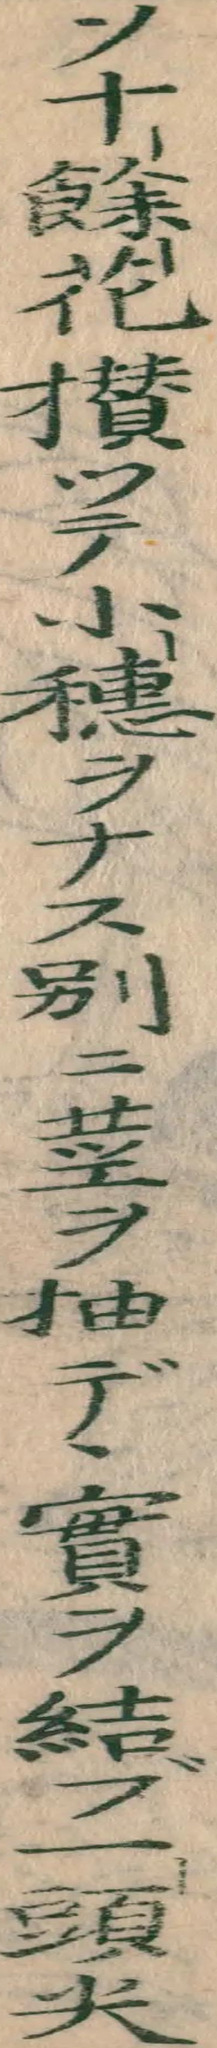ソ十-余-花攢ツテ小-穂ヲナス別ニ茎ヲ抽デヽ実ヲ結ブ一-頭尖
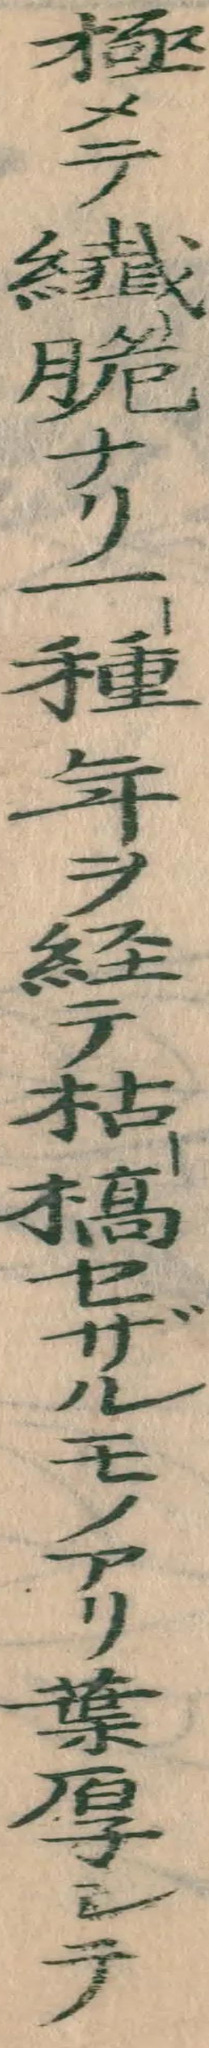極メテ繊-脆ナリ一-種年ヲ経テ枯-槁セザルモノアリ葉厚シテ
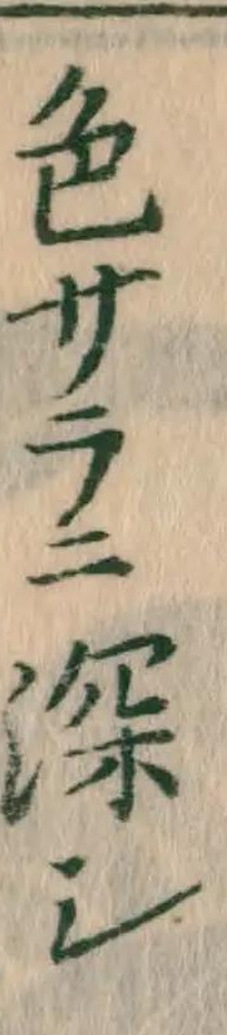色サラニ深シ

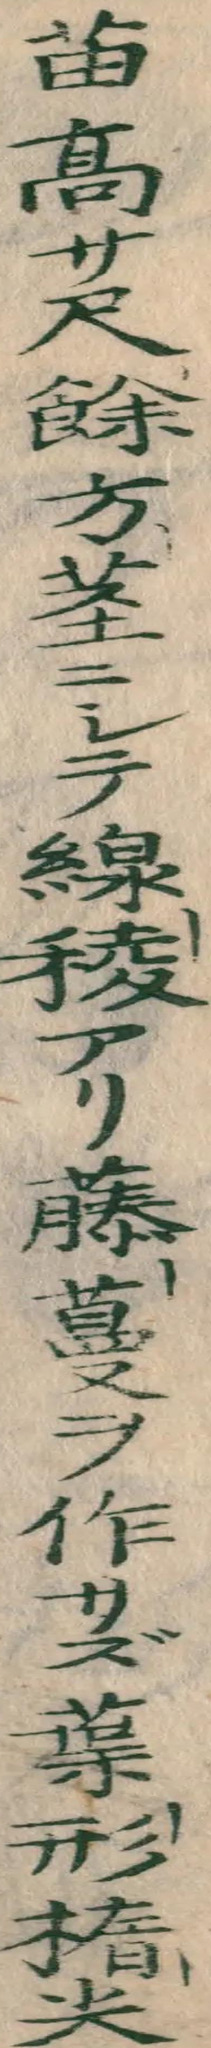苗高サ尺-余方-茎ニシテ線-稜アリ藤-蔓ヲ作サズ葉-形楕-尖
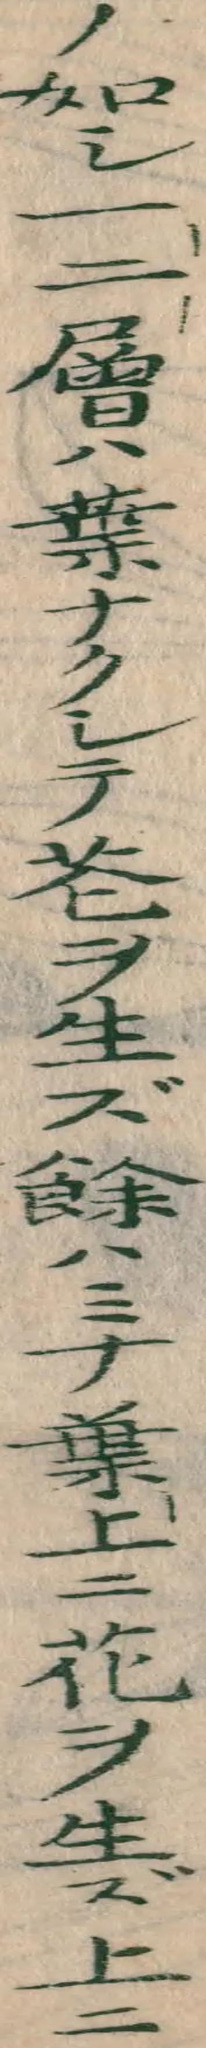ノ如シ一-二-層ハ葉ナクシテ花ヲ生ズ余ハミナ葉-上ニ花ヲ生ズ上ニ
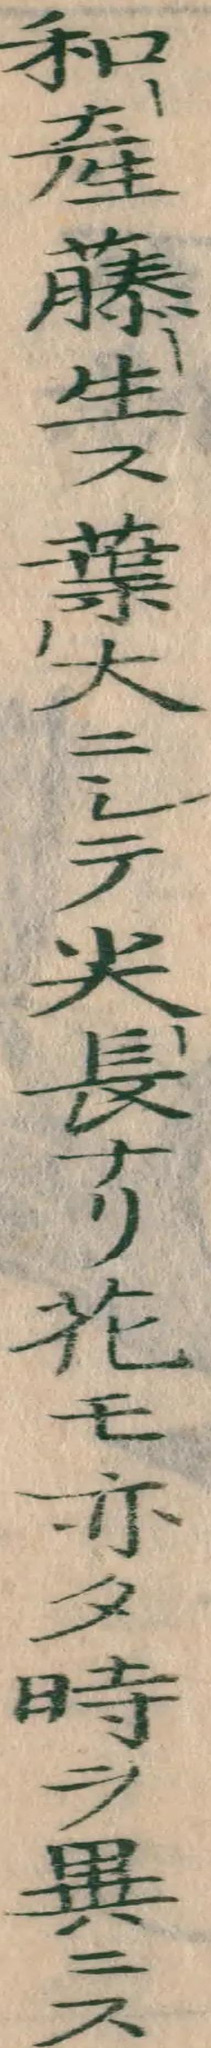和-産藤-生ス葉-大ニシテ尖-長ナリ花モ亦タ時ヲ異ニス
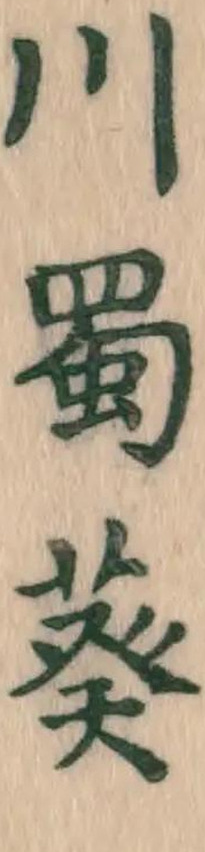川蜀葵

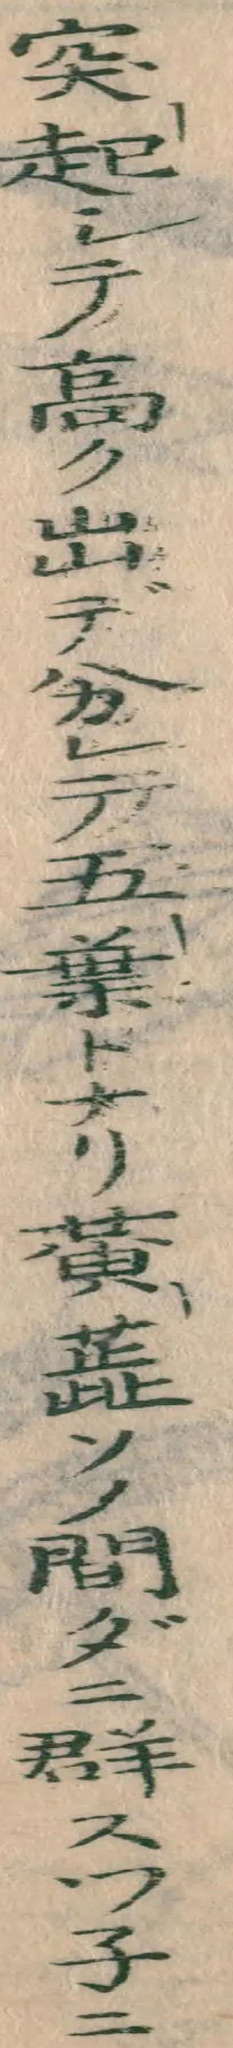突-起シテ高ク出デ分レテ五-葉トナリ黄-蕊ソノ間ダニ群スツネニ
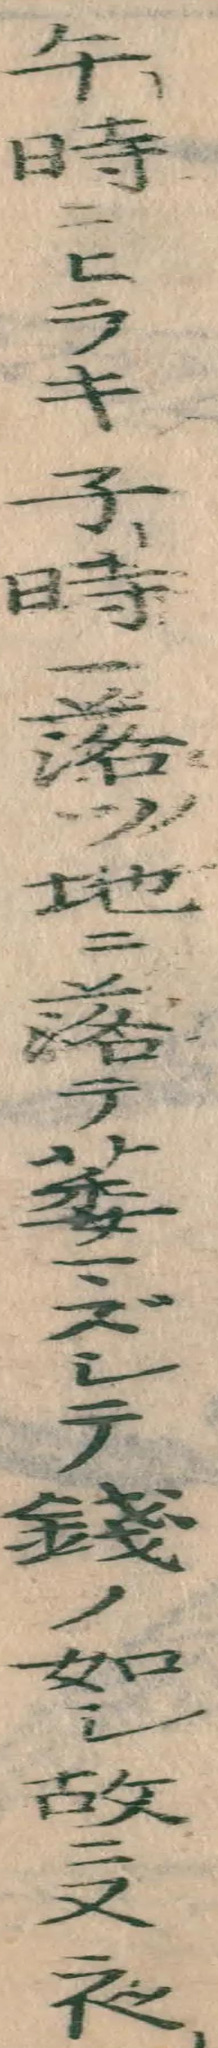午-時ニヒラキ子-時落ツ地ニ落テ萎マズシテ銭ノ如シ故ニ又夜-
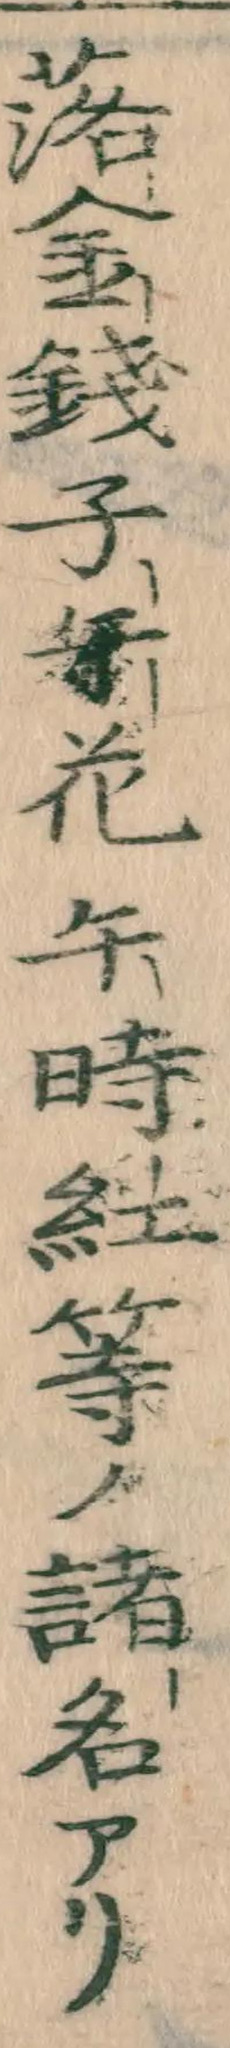落-金-銭子-午-花午-時-紅等ノ諸-名アリ

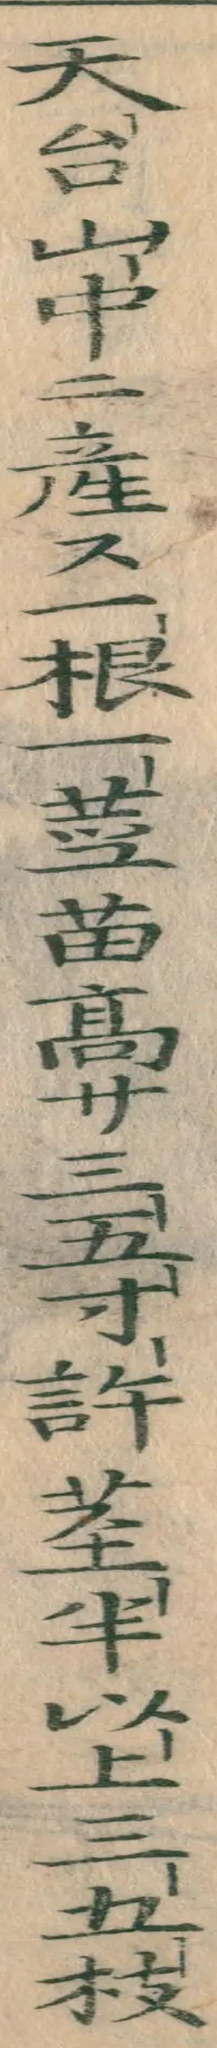天-台山-中ニ産ス一-根一-茎苗高サ三-五-寸-許茎-半以-上三-五-枝
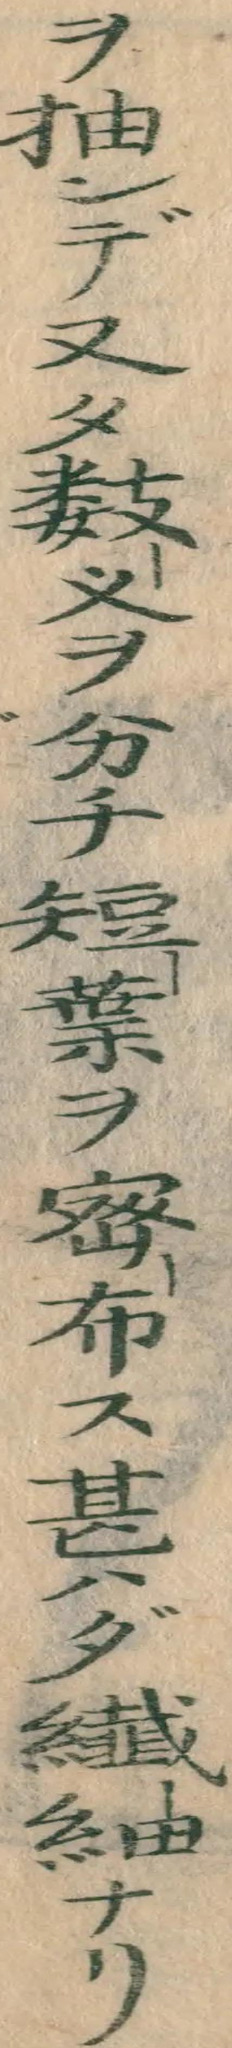ヲ抽ンデ又タ数-叉ヲ分チ短-葉ヲ密-布ス甚ハダ繊-細ナリ
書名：花彙 草部4巻木部4巻. [1]
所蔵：国立国会図書館 National Diet Library, JAPAN
